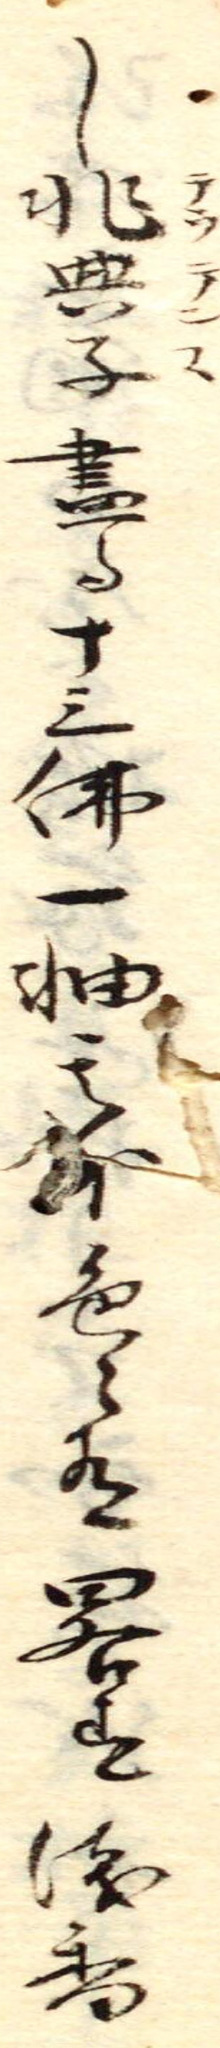し兆典子画る十三仏一軸其外色々有略す浅香
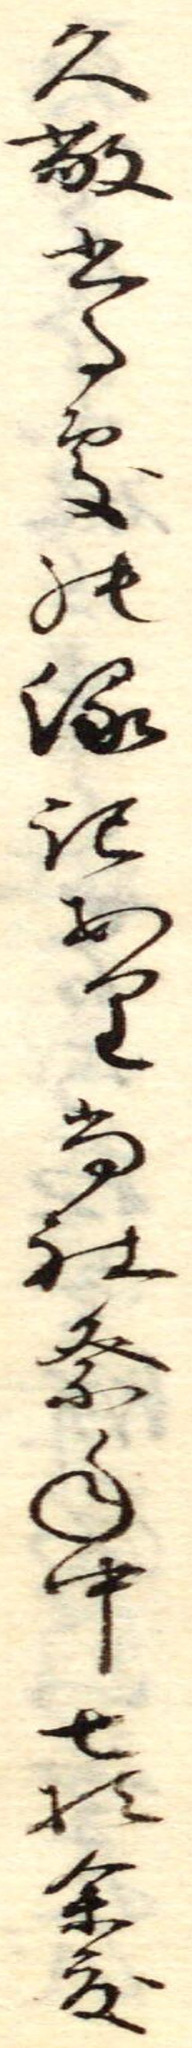久敬書る処の縁記あり尚社祭年中七拾余度
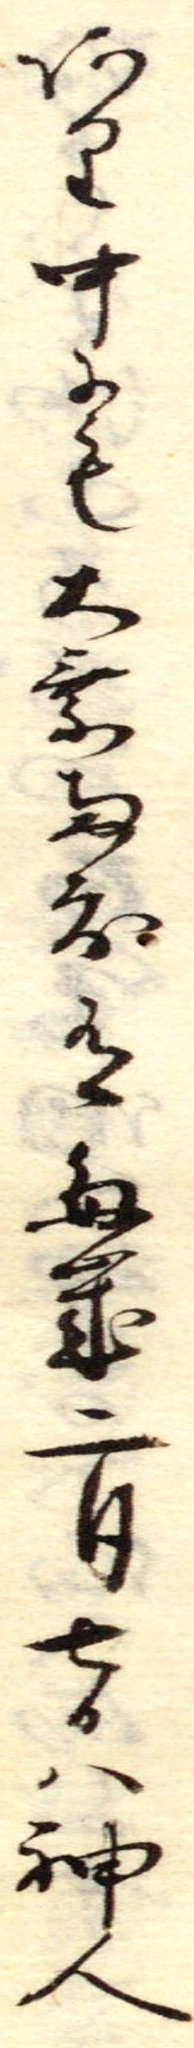あり中にも大乗両度有毎歳二月七日は神人
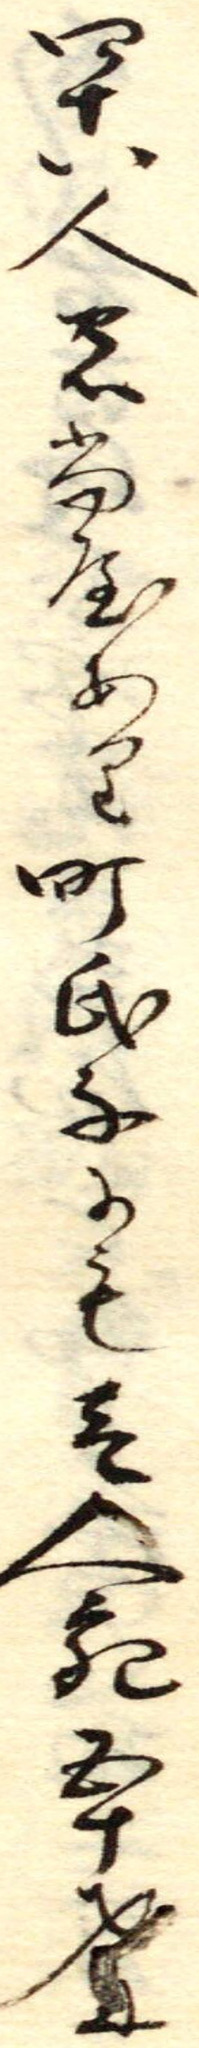四十八人の当屋あり町氏子にも壱人宛五十才上

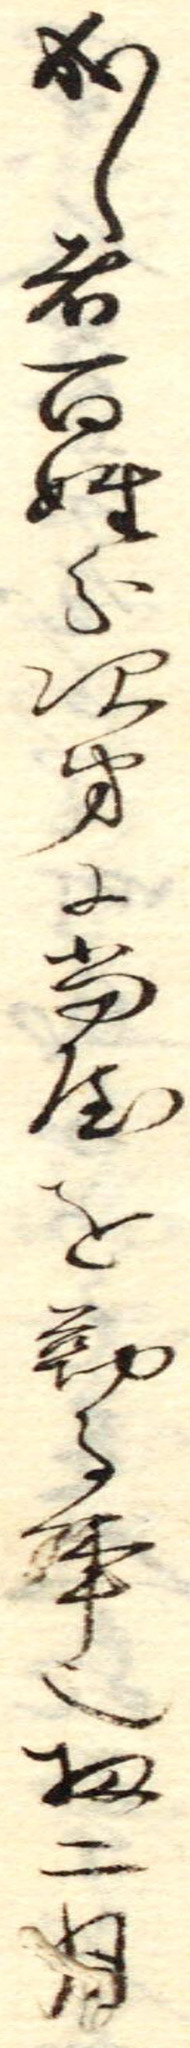成し者百姓分次第に当屋を勤る事也扨二月
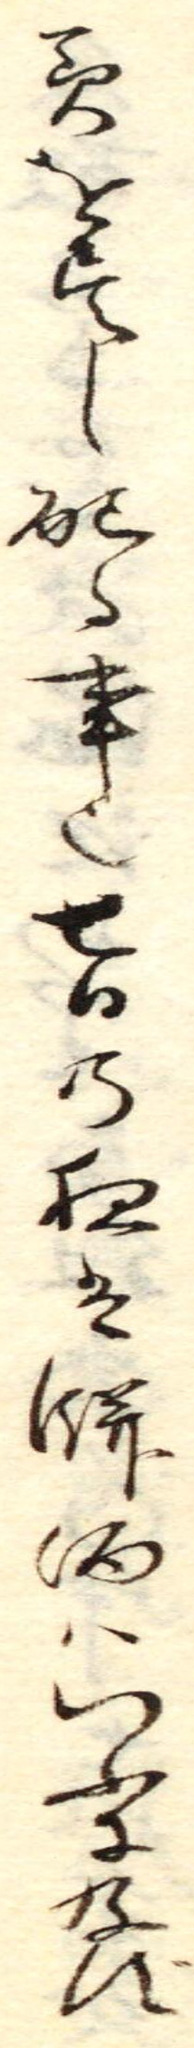美を尽し配る事也七日の夜は餅酒はいふに及ず
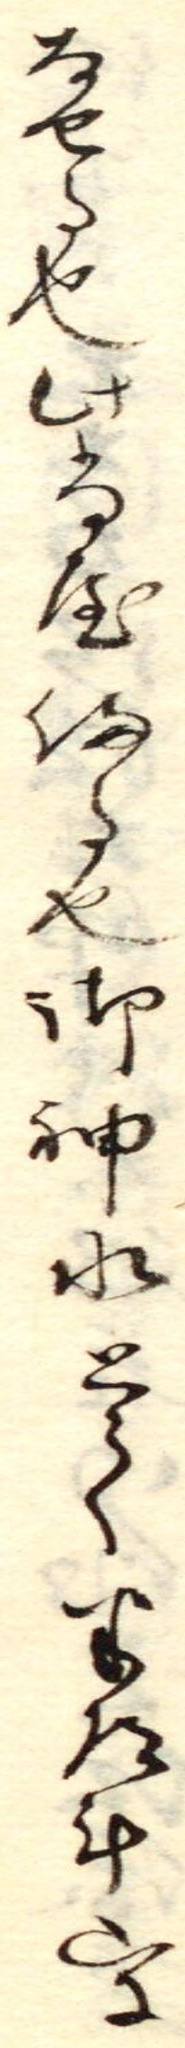なせる也此当屋備る也御神水とて半道斗山に
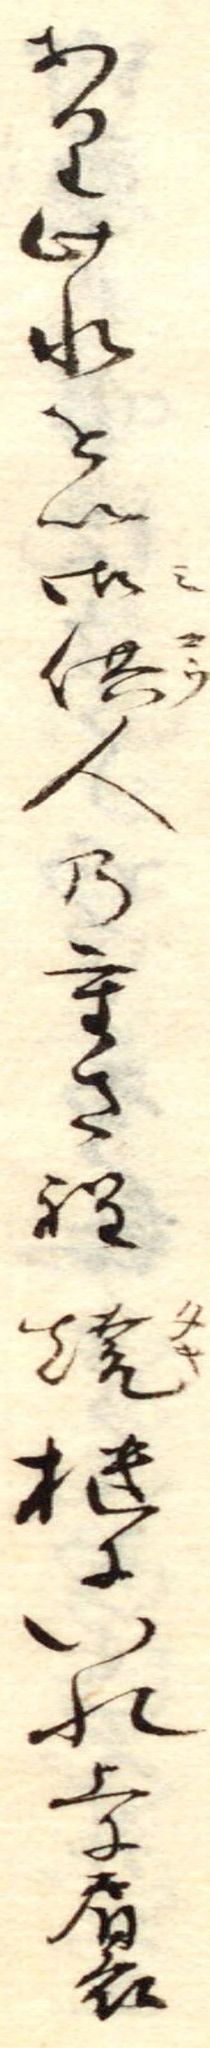あり此水を以御供人の重さ程焼櫃にいれ上に肩衣
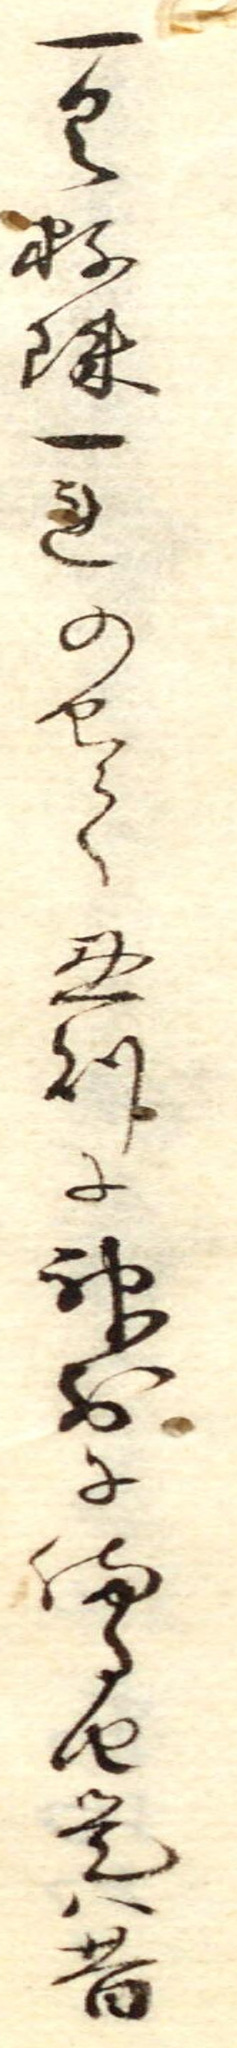一具数珠一連のせて丑刻に神前に備る由是は昔
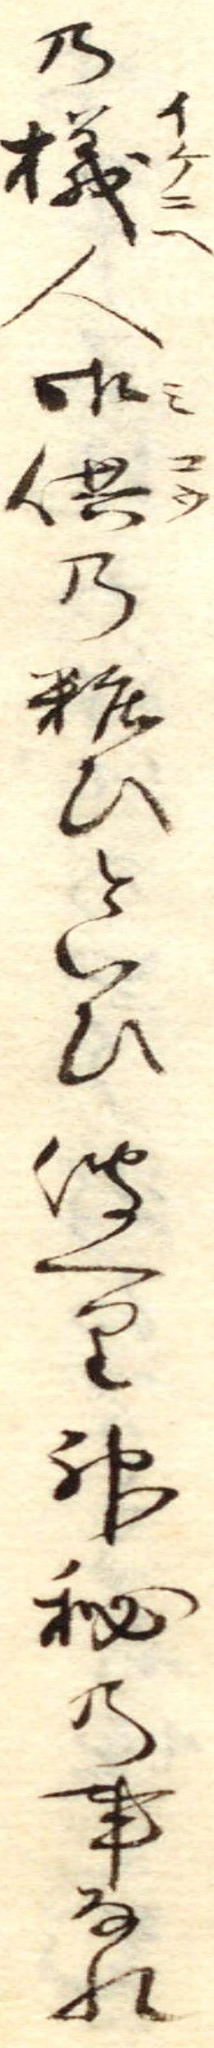の犠人御供の粧ひといひ伝へり神秘の事なれ
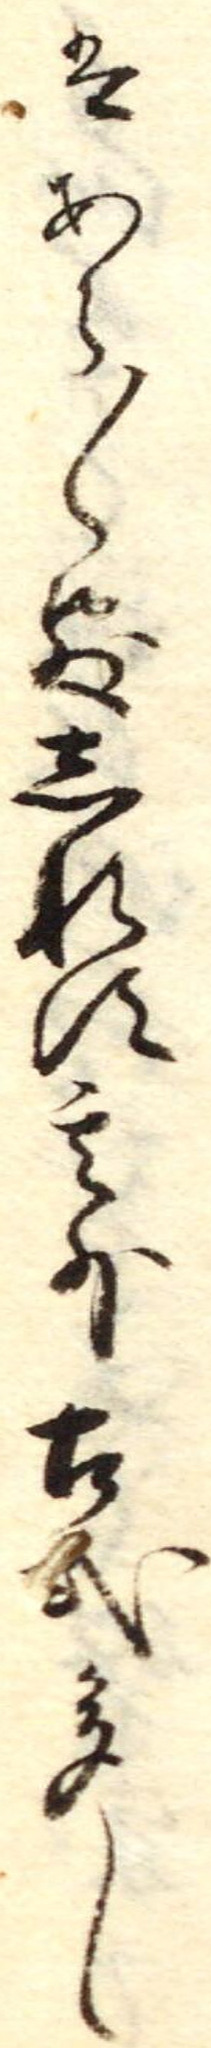はあら〳〵敷しれす其外古式多し
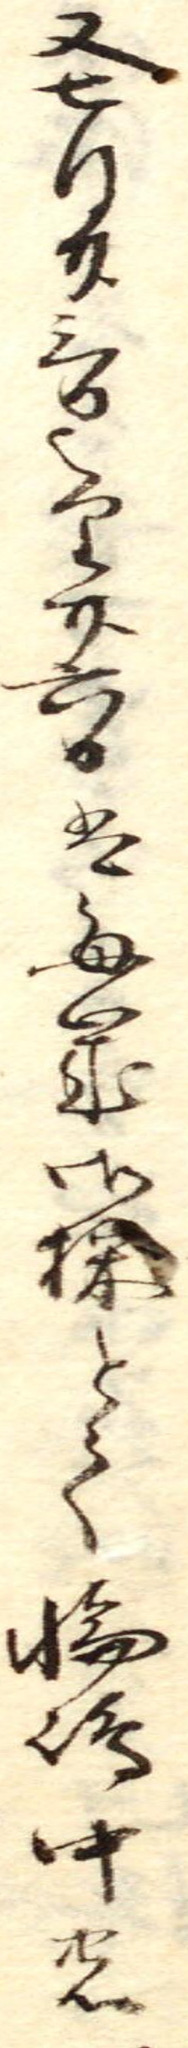又七月廿三日より廿六日は毎歳御揃とて輪嶋中の
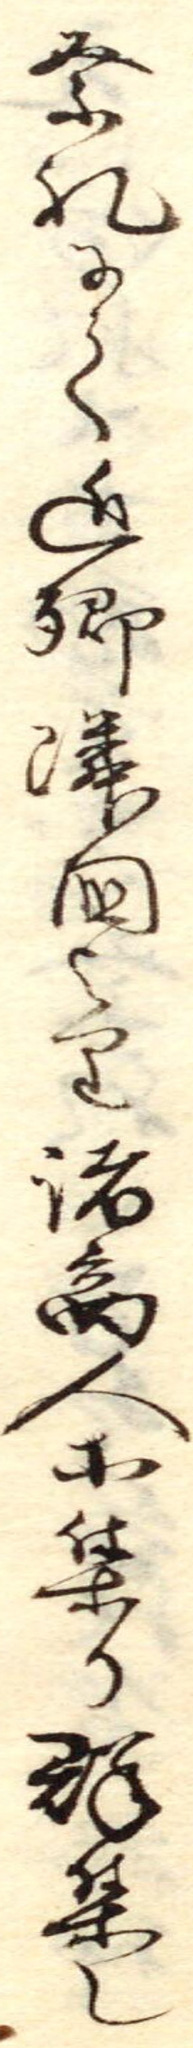祭礼にて近郷隣国より諸商人等集り群集し
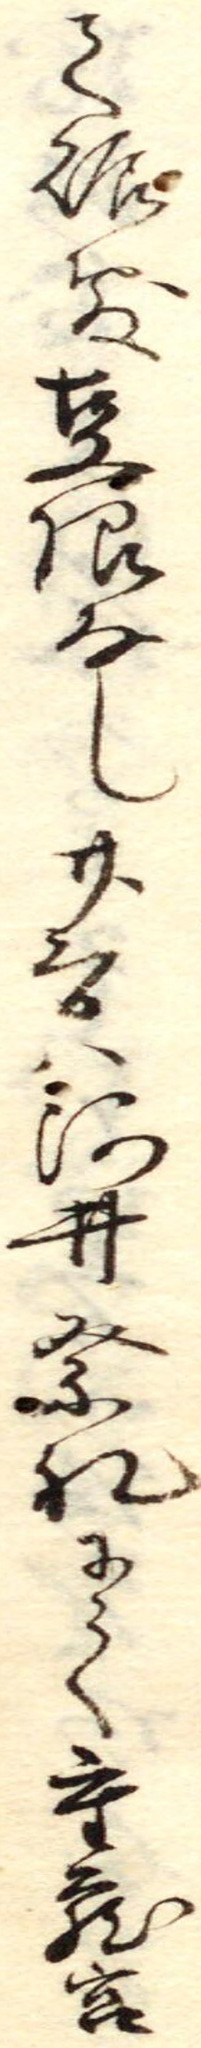て賑敷事限なし廿三日は河井祭礼にて重蔵宮
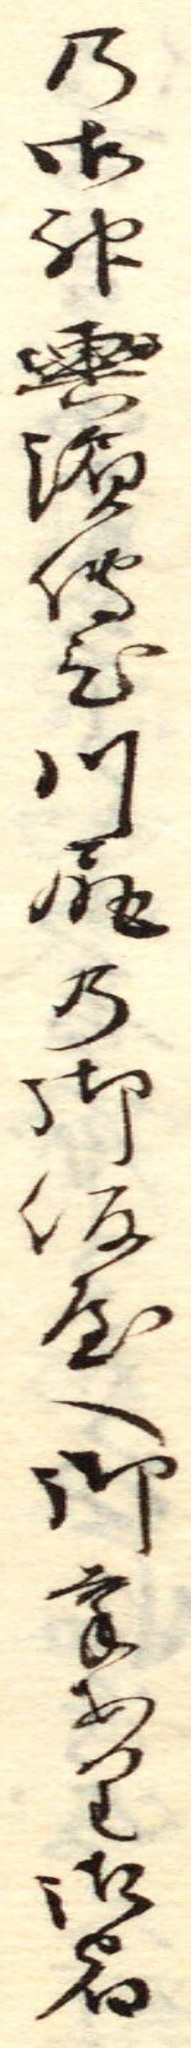の御神輿浜伝ひ川尻の御仮屋へ御幸あり御宿
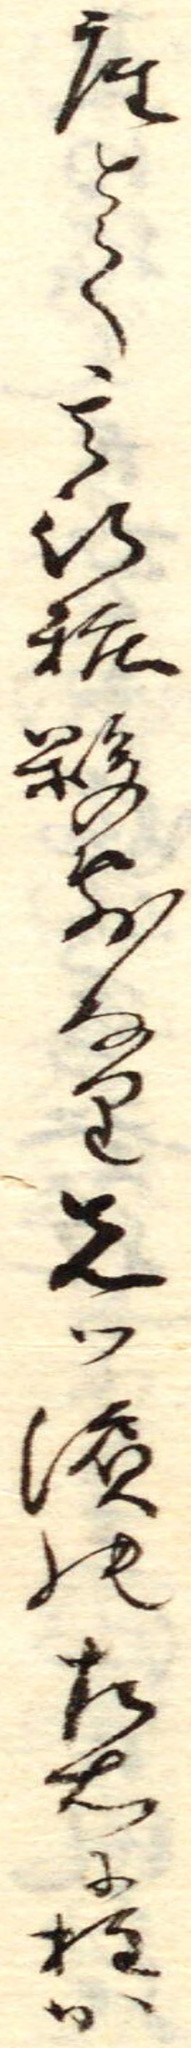座とて其行粧夥敷なり先ッ浜の左右に柱か
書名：能登名跡誌
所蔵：Ishikawa Prefectural Library
